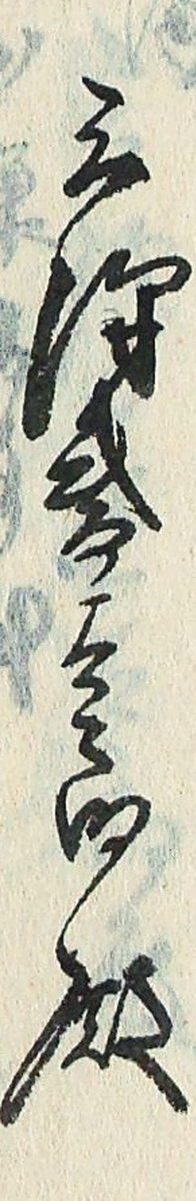三沢春太郎殿
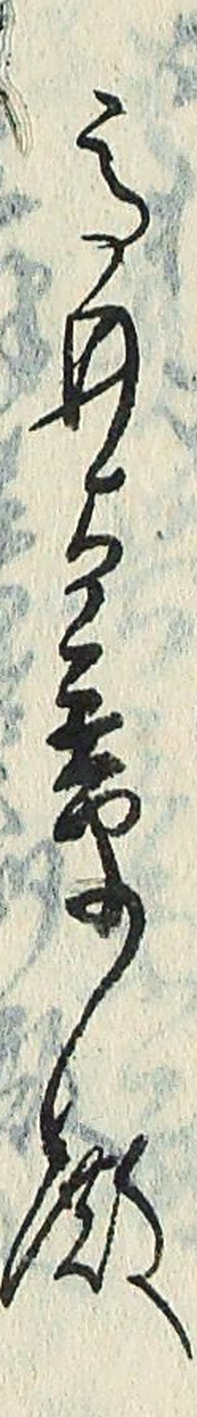高井与三兵衛殿
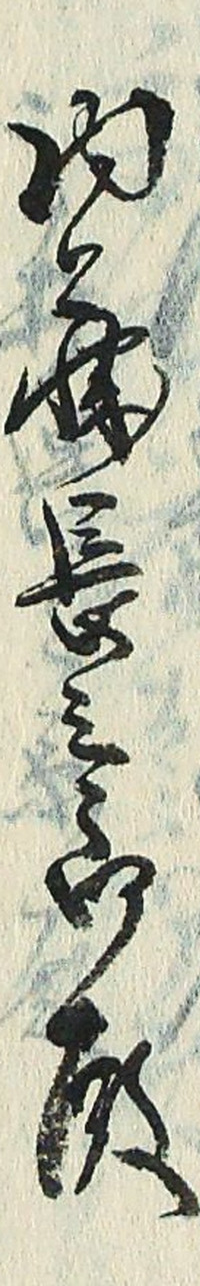内藤長三郎殿
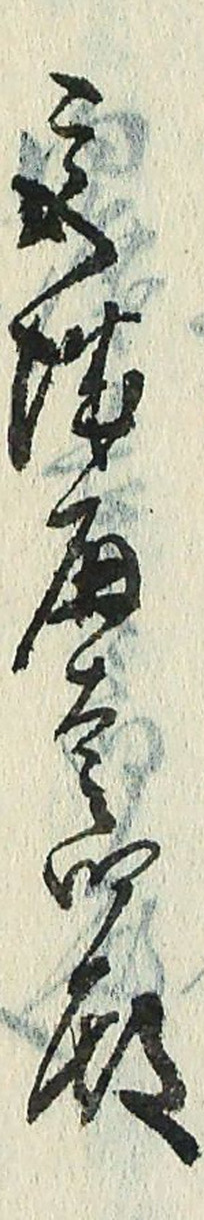宮城麻太郎殿
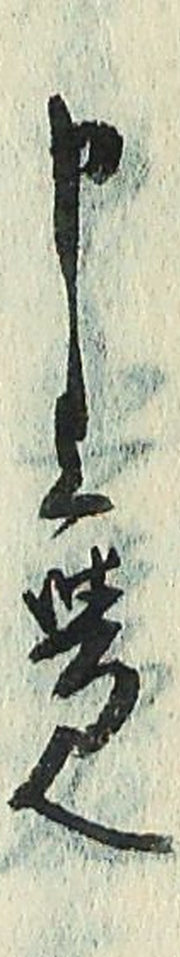申上覚
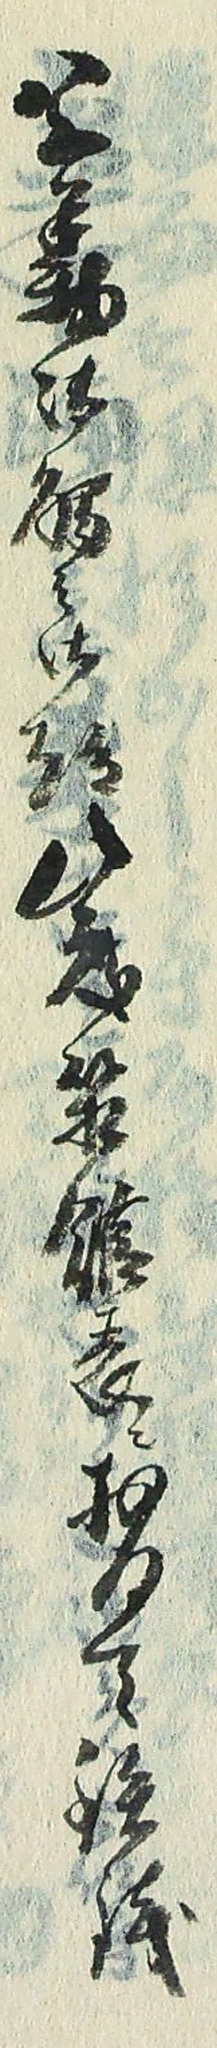公義御触之御趣此度箱館表におゐて鉄銭
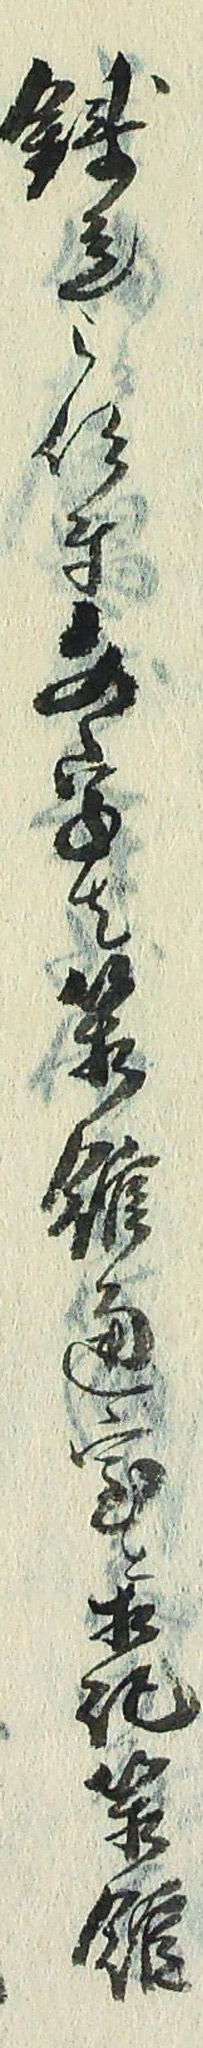鋳造被仰付文字は箱館通宝と相記箱館
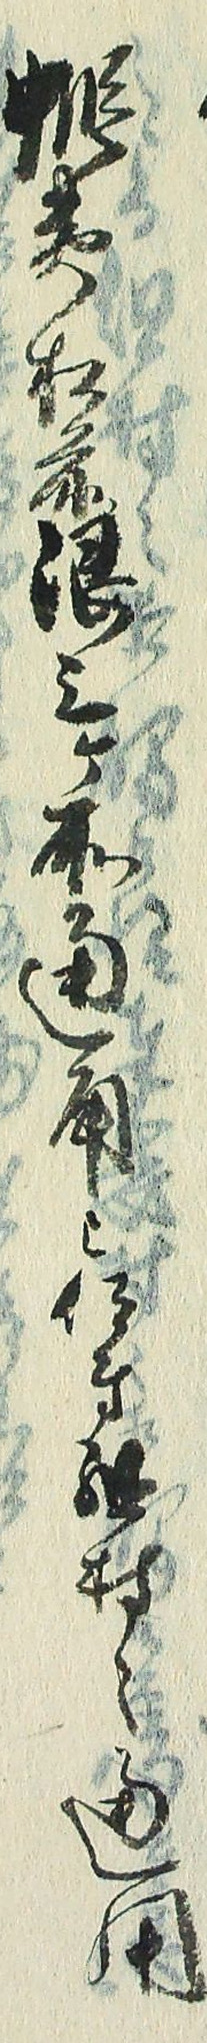蝦夷松前限三ケ所通用被仰付組村々通用
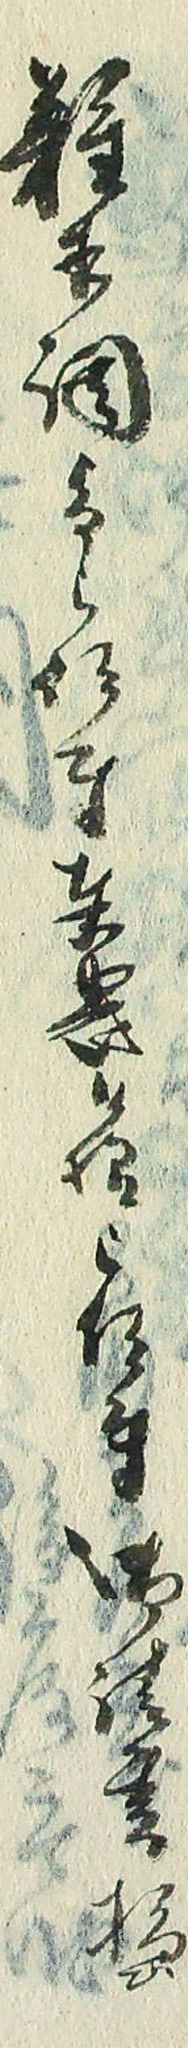難相調旨被仰付奉畏候様被仰付御請書指出
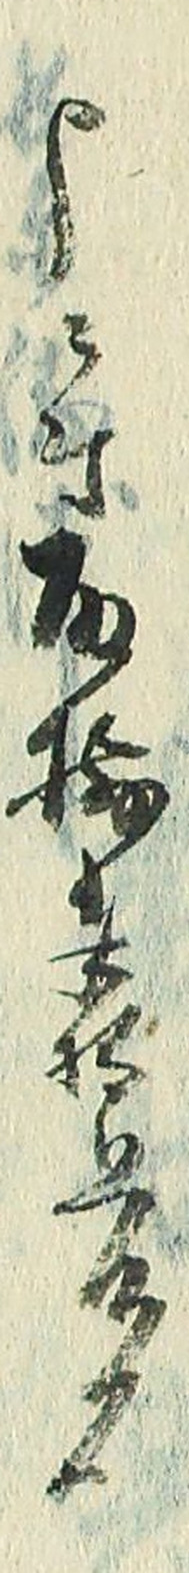申に付取揃奉指上候以上
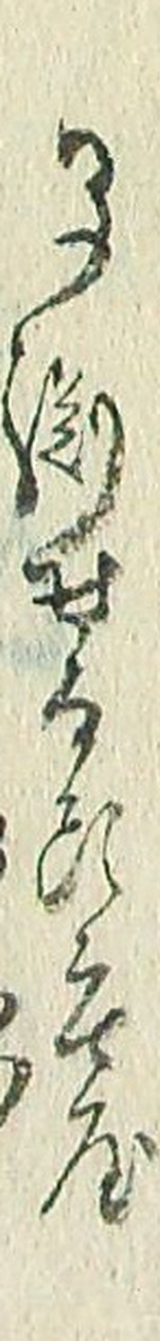早淵村与頭庄屋

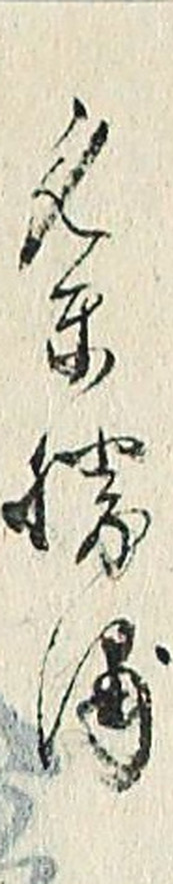名東勝浦
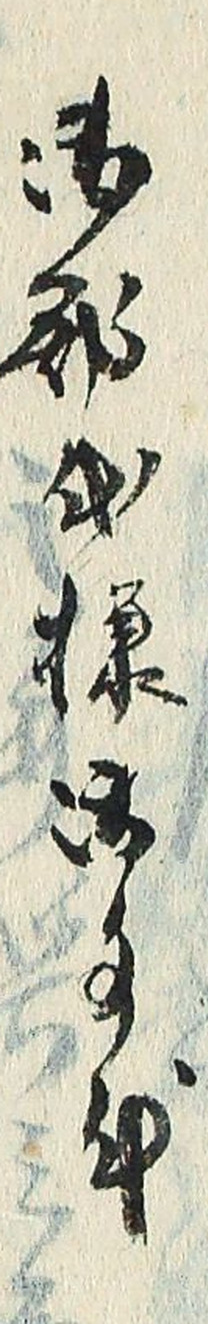御郡代様御手代
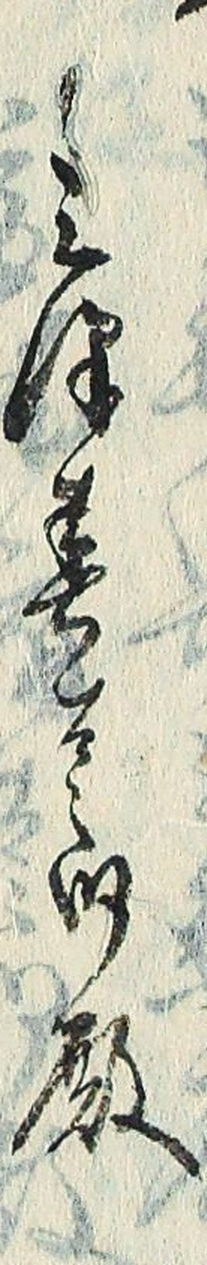三沢春太郎殿
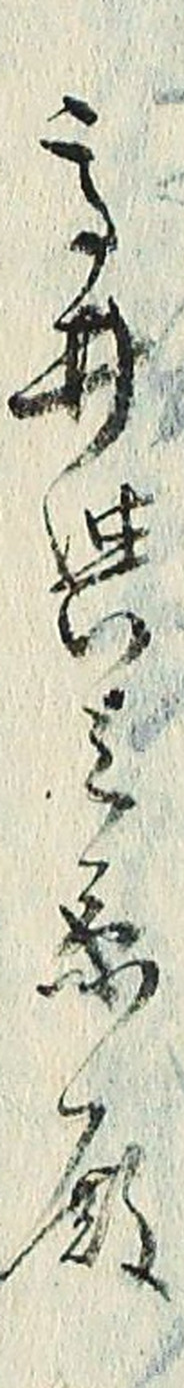高井与三兵衛殿
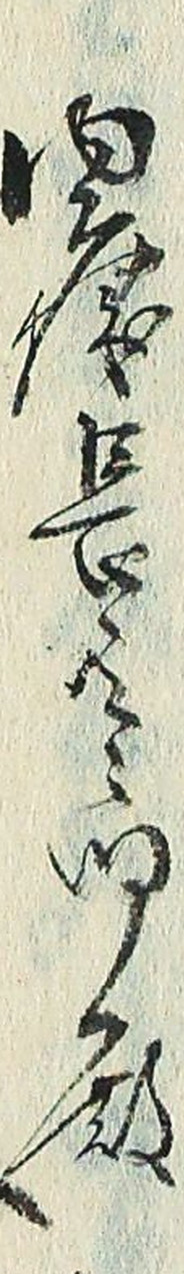内藤長三郎殿
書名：諸御用御□受書控
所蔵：鳴門教育大学 Naruto University of Education
